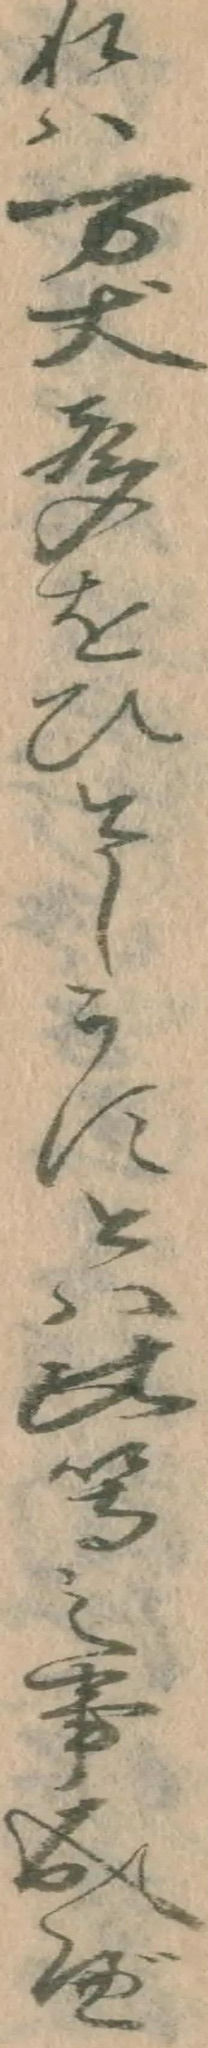れは万犬声をひとしう須とは此等之事成扁
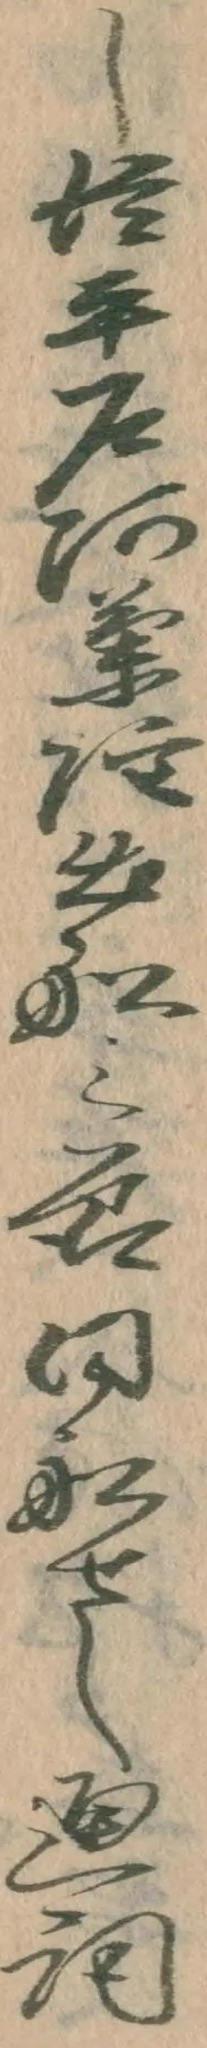し従平戸阿蘭陀出舩之節同舩せし通詞
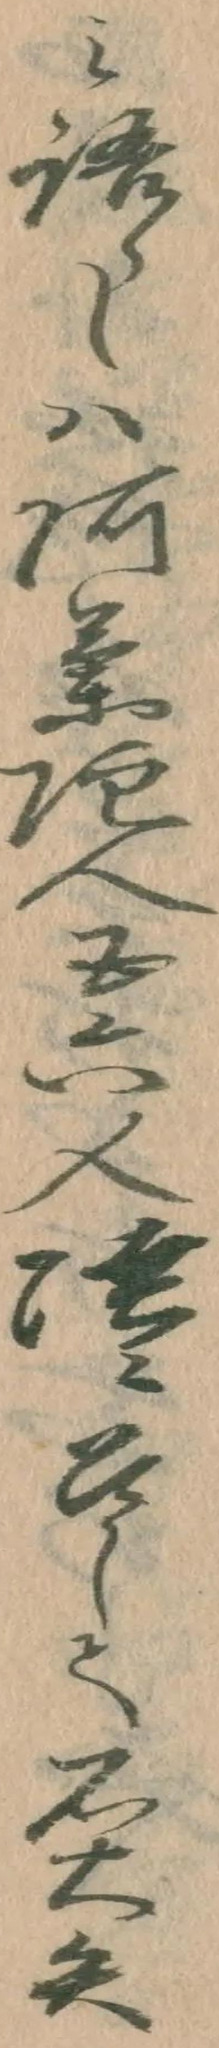之語りしは阿蘭陀人五六人陸に召して石火矢
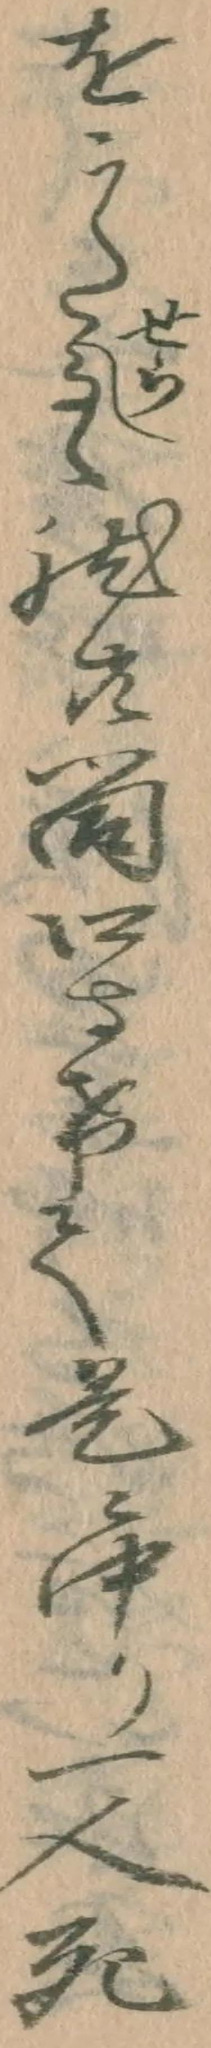をうたせらるゝ然共筒口さ希て是に中り一人死
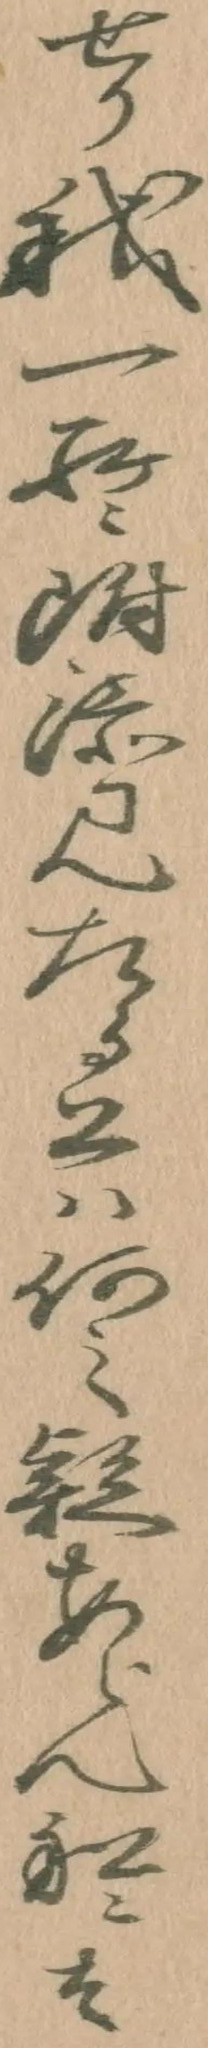せり我一所に附添見たる上は何之疑あらん舩に者
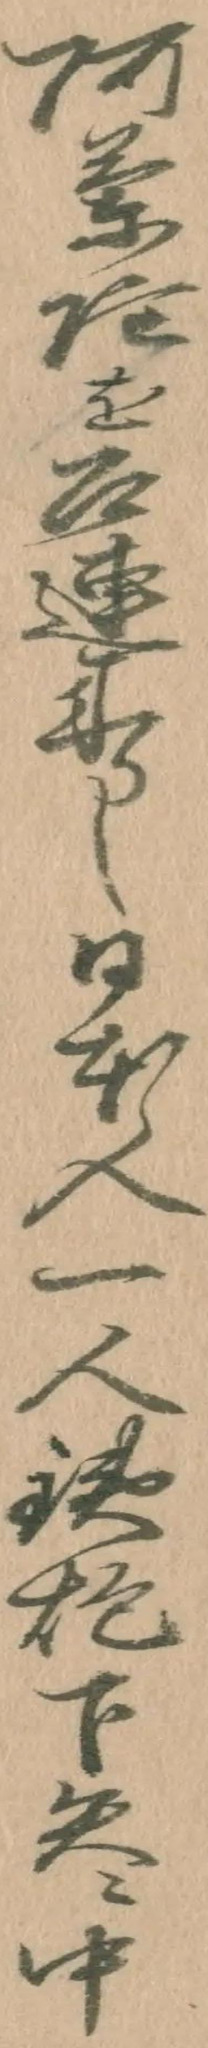阿蘭陀を召連来りし日本人一人鉄砲下矢に中
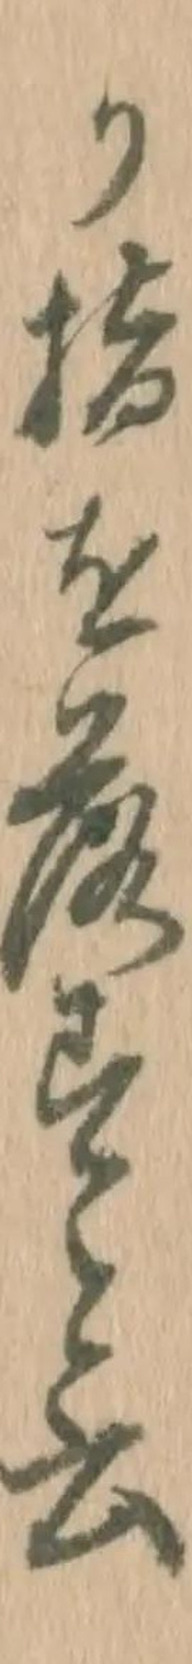り指を落春と云
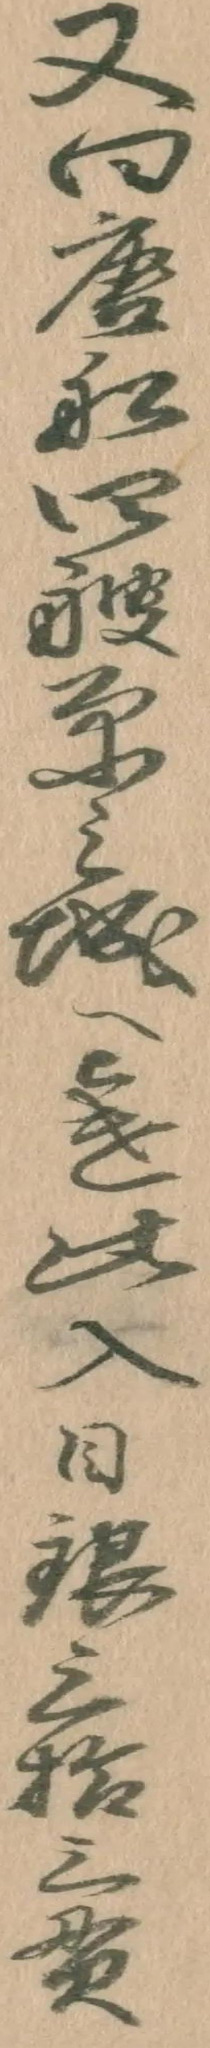又曰唐舩四艘原之城へ被遣此入日銀三拾三貫
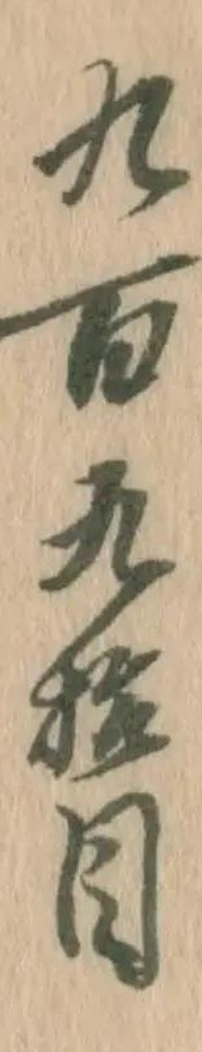九百九拾目
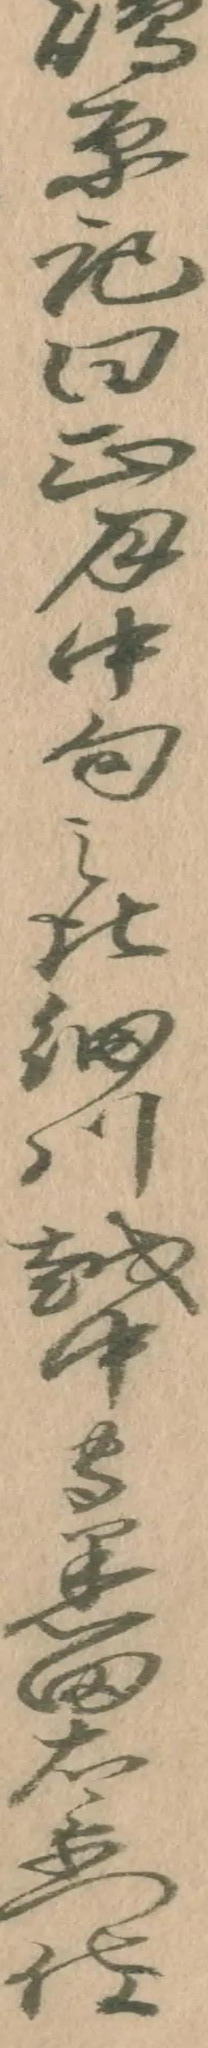島原記曰正月中旬之比細川越中守黒田右衛門佐
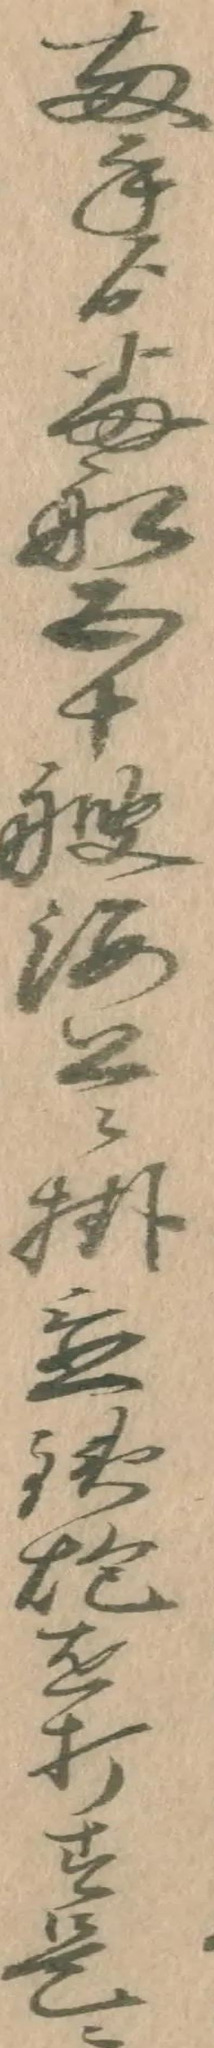両手ゟ番舩五十艘海上に掛置鉄砲を打春是に
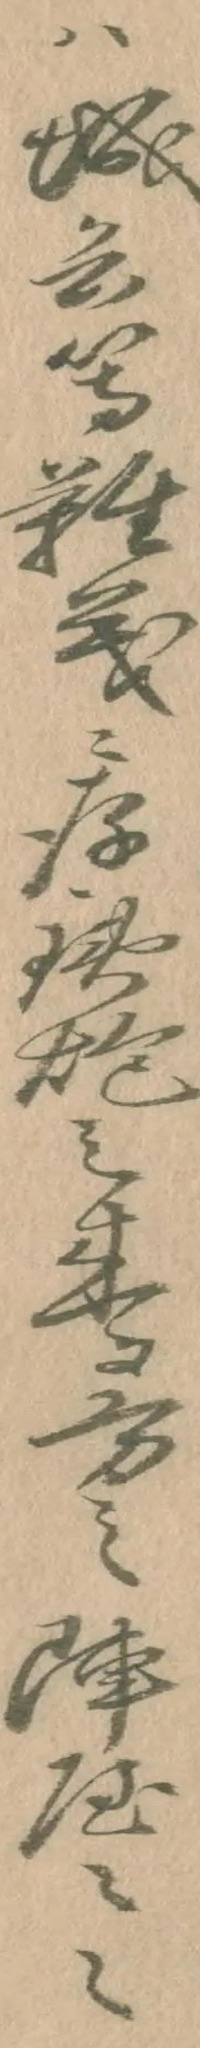は城兵等難義に存鉄砲之来る方之陣屋々々
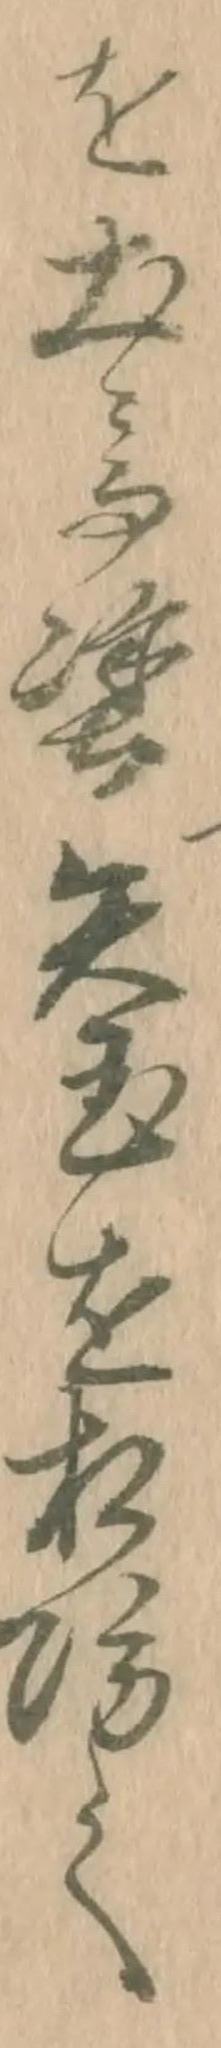を出に而壁矢玉を相防く
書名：切支丹御退治記 49巻. [5]
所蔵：国立国会図書館 National Diet Library, JAPAN
